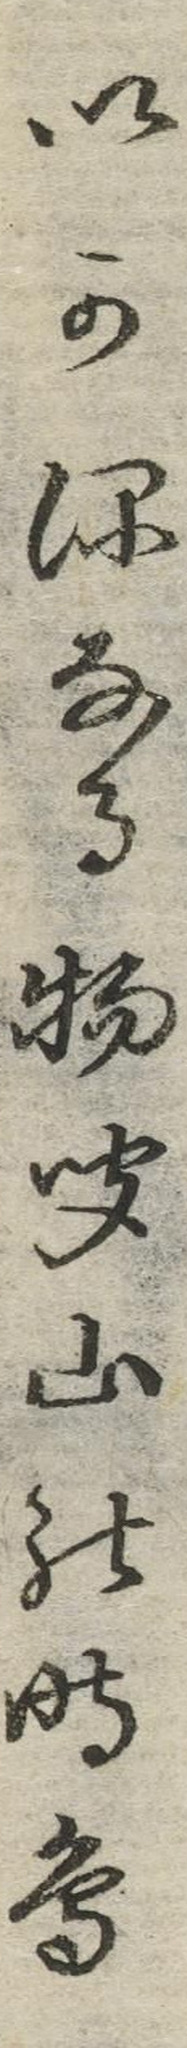伊香保なる物聞山の時象
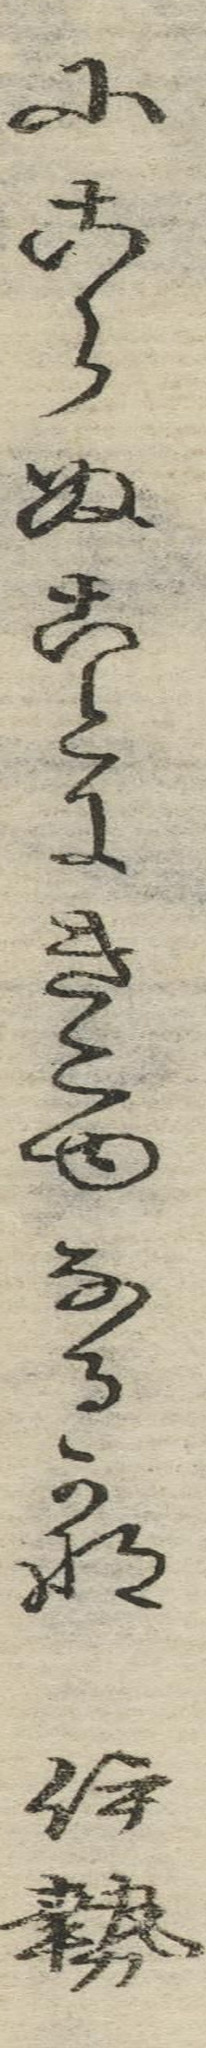にこらぬことにきこゆなるかな伊勢

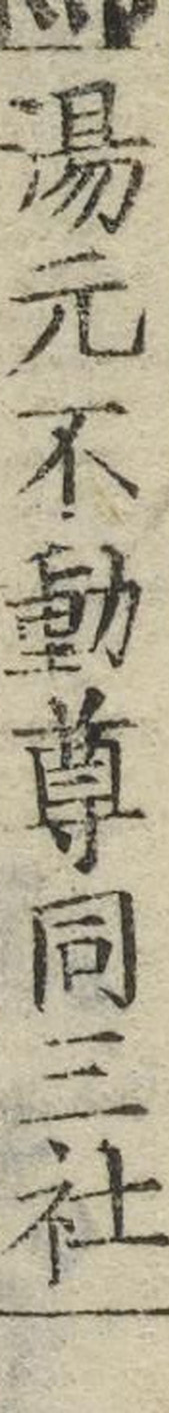湯元不動尊同三社
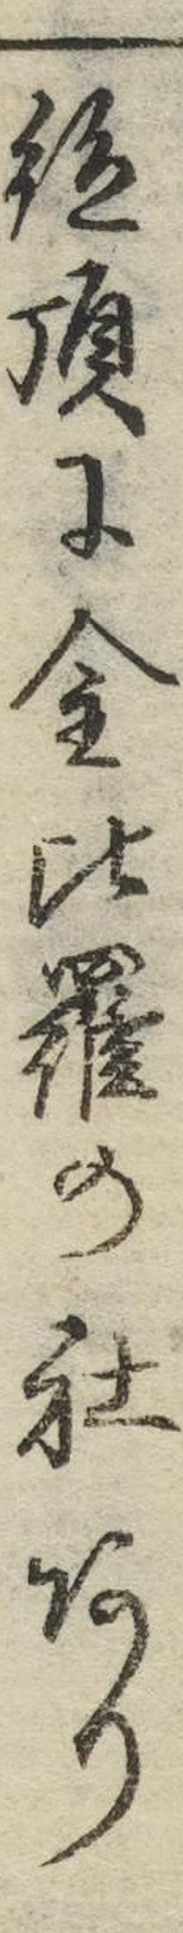絶頂に金比羅の社あり
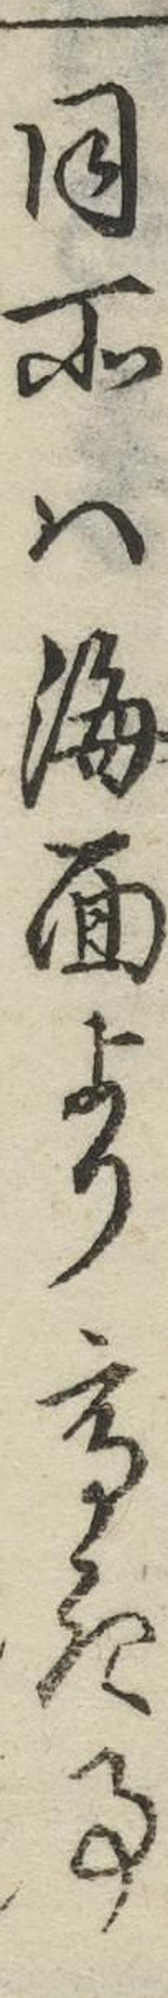同所は海面より高き事
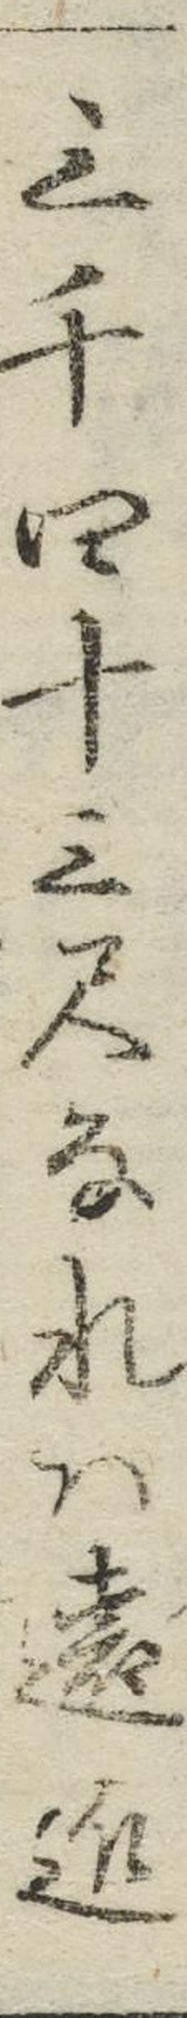三千四十三尺なれは遠近
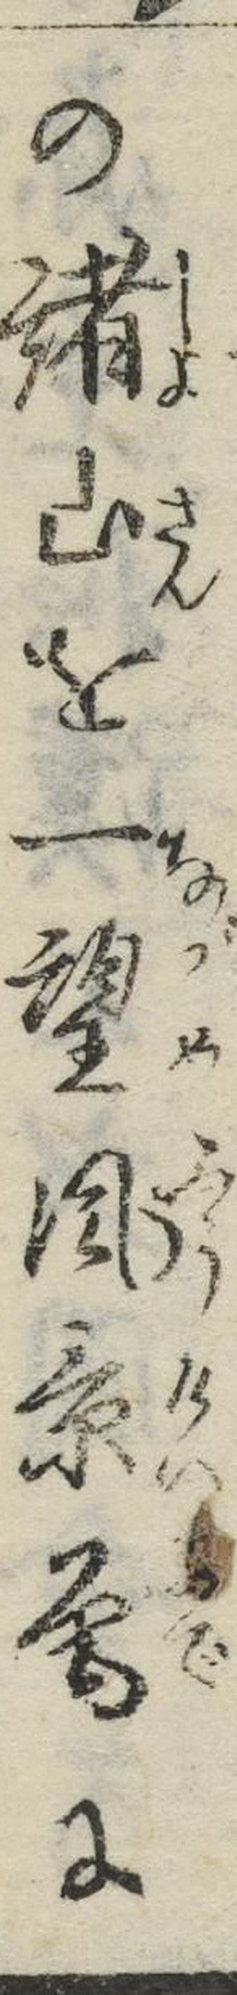の諸山を一望風景筆に
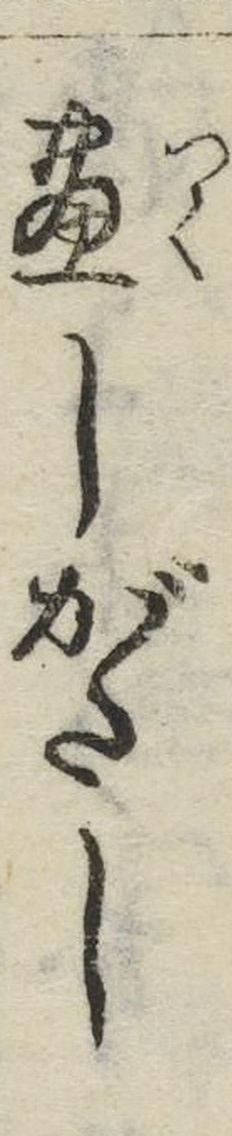盡しがたし
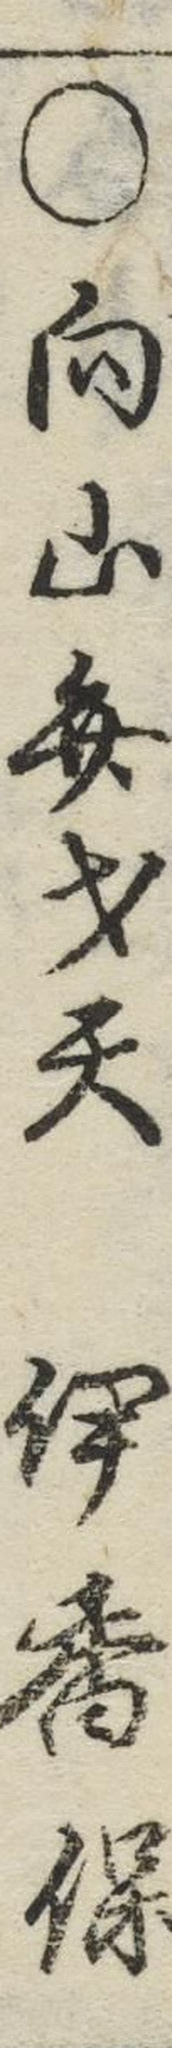○向山弁財天伊香保
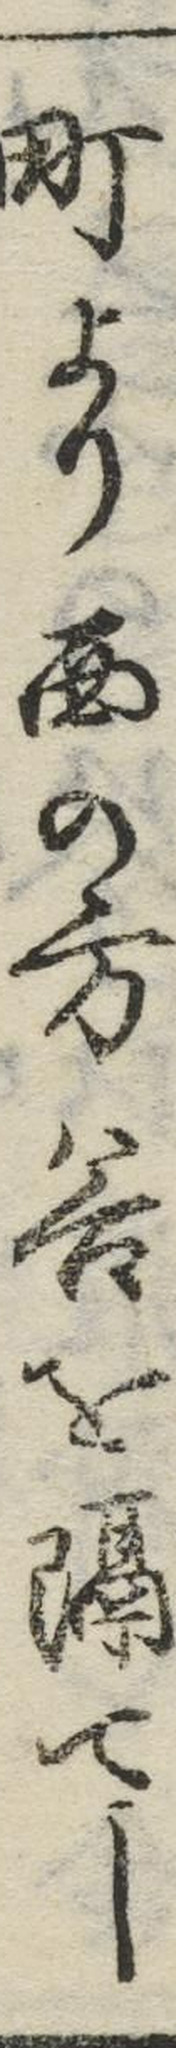町より西の方溪を隔てし
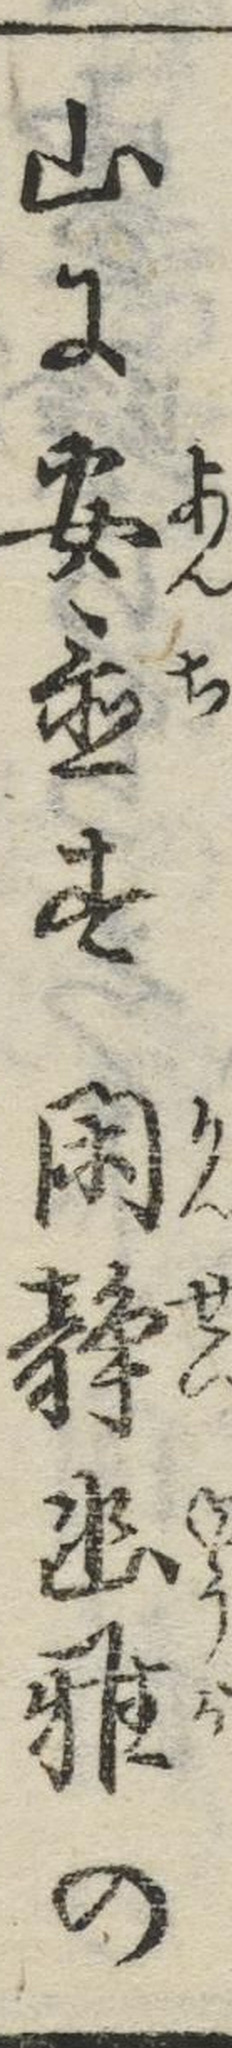山に安置す閑静幽雅の
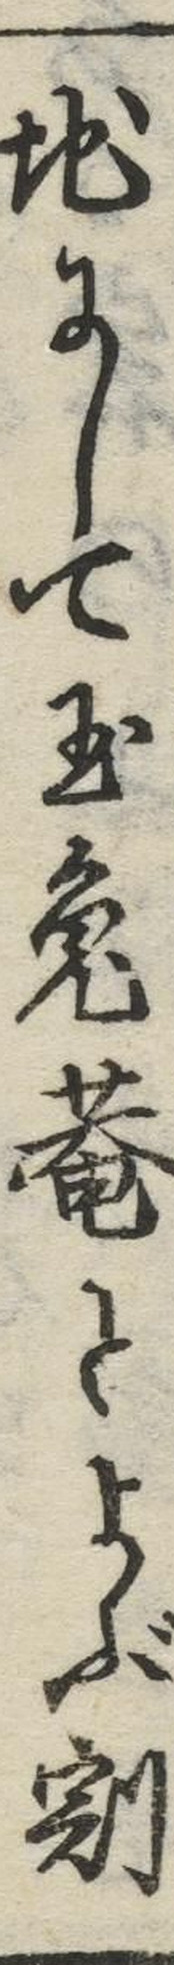地にして玉兔菴とよぶ割
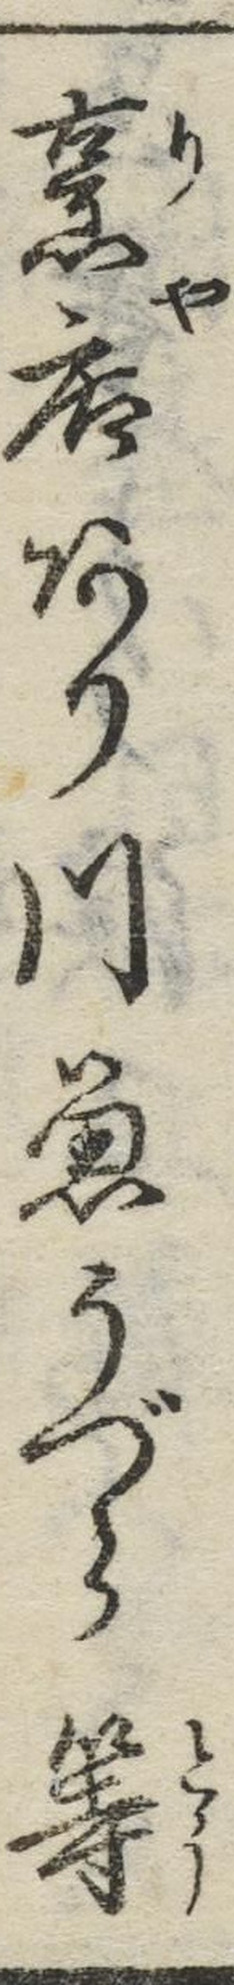烹店あり川魚うづら等
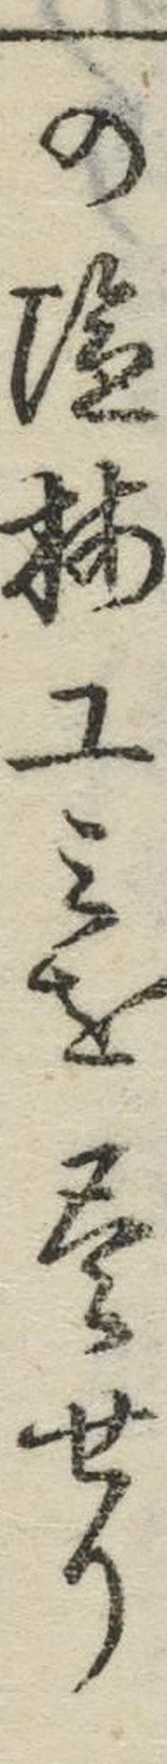の塩梅工みを尽せり
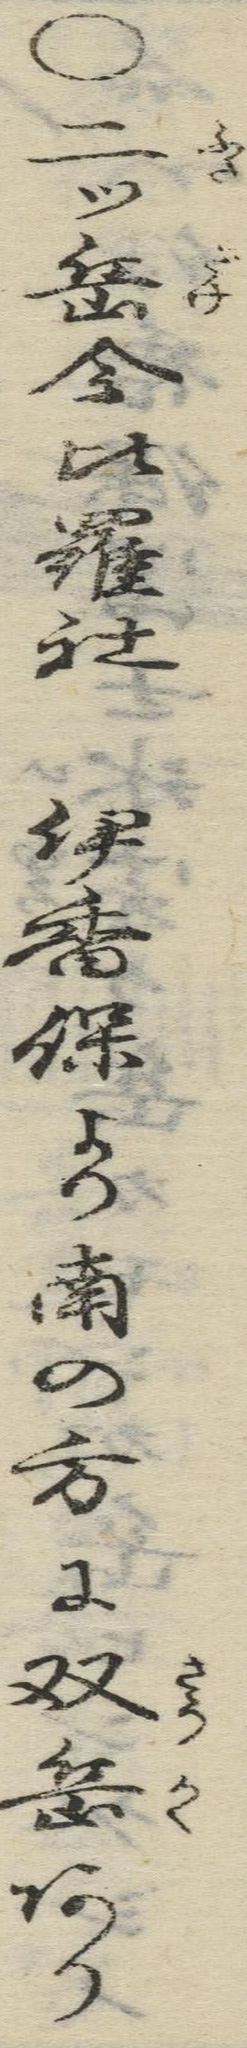○二ッ岳金比羅社伊香保より南の方に双岳あり
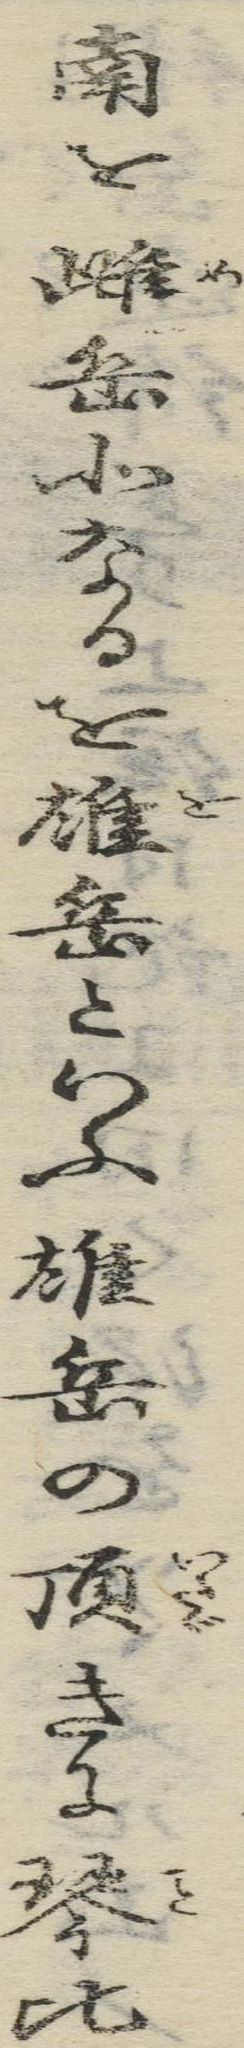南を雌岳北なるを雄岳といふ雄岳の頂きに琴比
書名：上州伊香保鑛泉圖會　全
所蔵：東京大学地震研究所図書室 Earthquake Research Institute Library, The University of Tokyo, JAPAN
